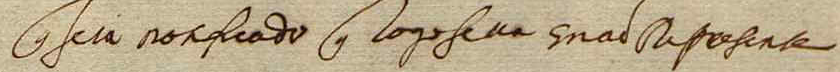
q̄ seia noteficado q̄ logo se ua E naõ Represente
